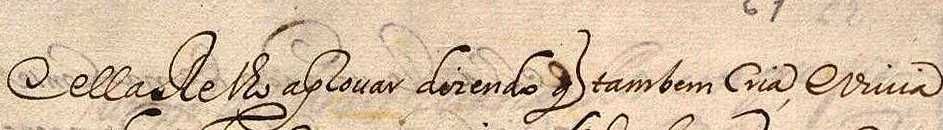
E ella Re lho apRouar dizendo q̄ tambem Cria e viuia
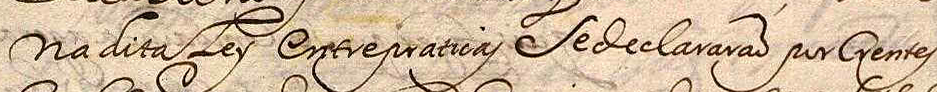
na dita Ley entre praticas Se declararaõ por Crentes
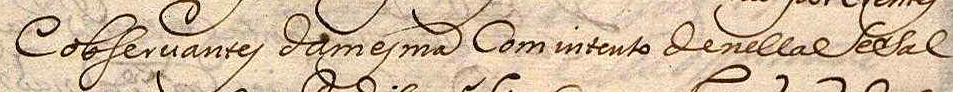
e obseruantes da mesma Com intento de nella Se Sal
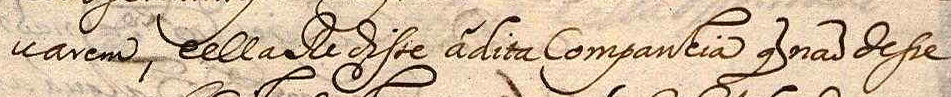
uarem, e ella Re disse á dita Companhia q̄ naõ desse
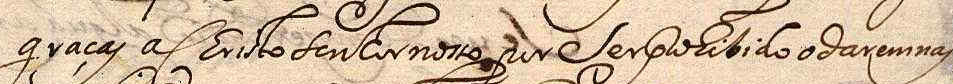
graças a Christo senhor nosso per Ser pRohibido o daremnas
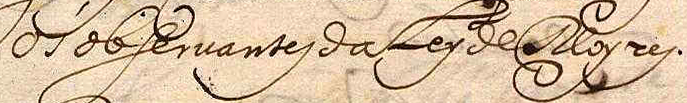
Os obseruantes da Ley de Moyzes.
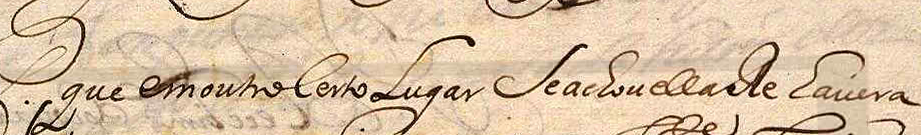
que em outro Certo Lugar Se achou ella Re hauera
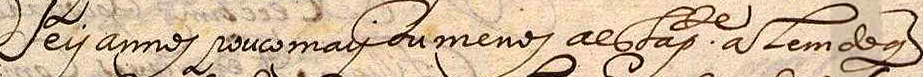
seis annos pouco mais ou menos a esta p.te aLem do q̄
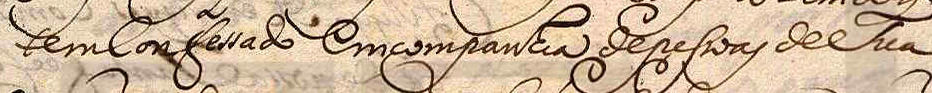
tem Confessado em companhia de pessoas de Sua
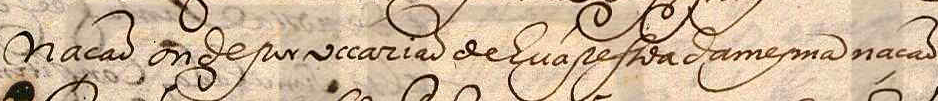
nação onde por occaziaõ de huā pessoa da mesma naçaõ
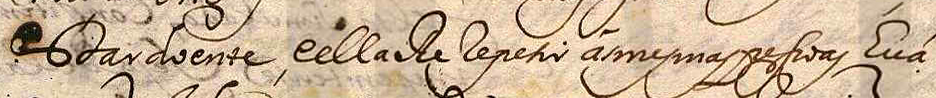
Estar doente, e ella Re Repetir as mesmas pessoas huā
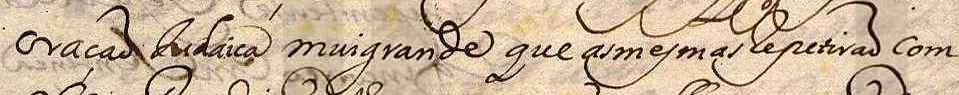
oraçaõ Judaica mui grande que as mesmas Repetiraõ com
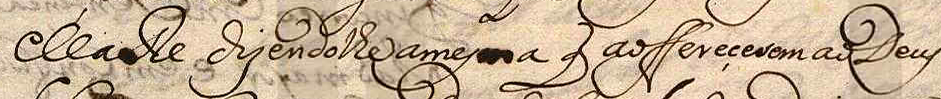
Ella Re dizendolhe a mesma q̄ a offerecesem ao Deus
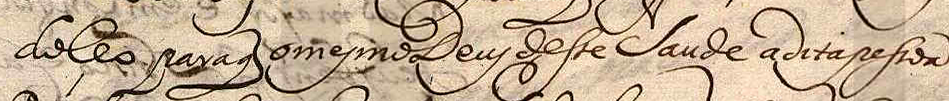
do Ceo para q̄ o mesmo Deus desse Saude a dita pessoa
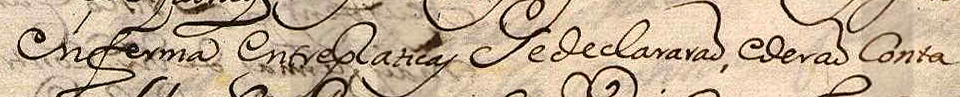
Enferma entre pRaticas Se declararaõ, e deraõ Conta
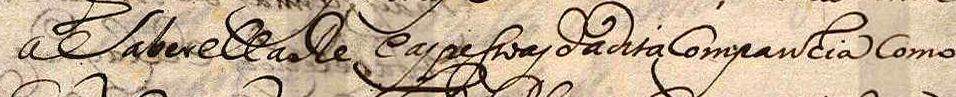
a Saber ella Re e as pessoas da dita Companhia Como
